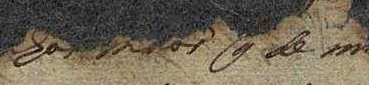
has _ maõs q̄ de m
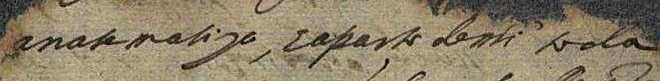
anatematizo, E aparto de mi toda
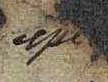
espe
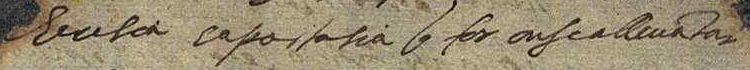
heresia E apostasia q̄ for ou se alleuātar
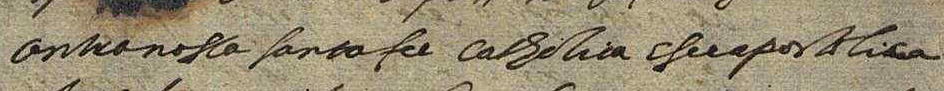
contra nossa santa fee catholica E see apostolica
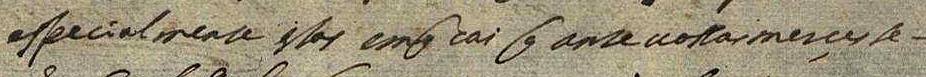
especialmente estas em q̄ cai q̄ ante uossas merces te
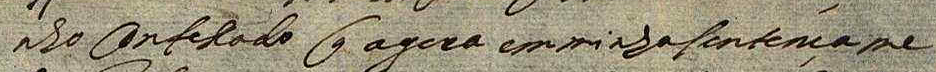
nho Confessado q̄ agora em minha sentença me
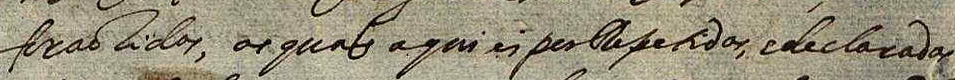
foraõ lidas, as quais aqui ei per Repetidas, e declaradas
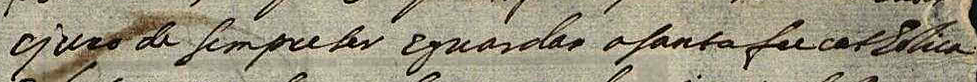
e juro de sempre ter e guardar a santa fee catholica
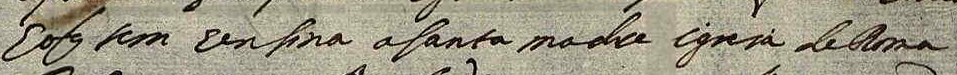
E o q̄ tem E ensina a santa madre igreia de Roma
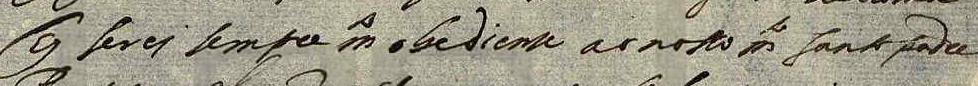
q̄ serei sempre mto obediente ao nosso mto santo padre
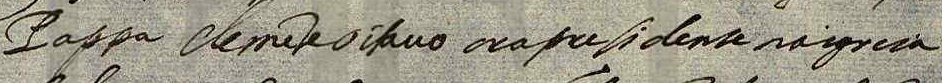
Pappa Clemēte oitauo ora presidente na igreia
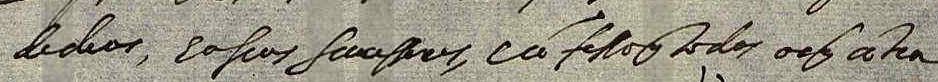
de deos, E a seus sucessores, e cōfesso q̄ todos os q̄ cōtra
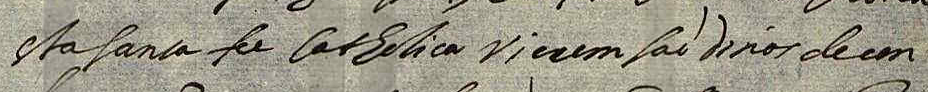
esta santa fee catholica vierem saõ dinos de con
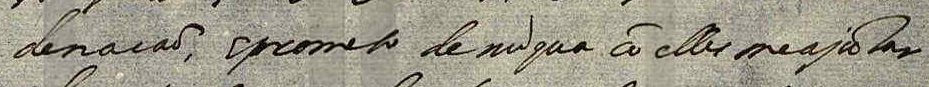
denaçaõ, E prometo de nūqua cō elles me ajūtar
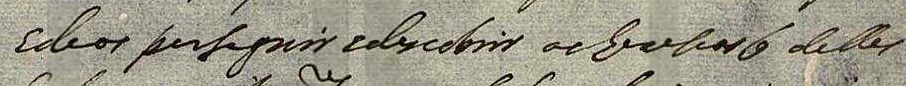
E de os perseguir E descobrir as heresias q̄ delles
